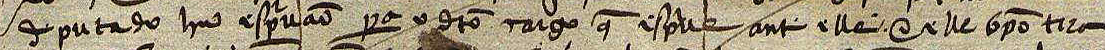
deputado hū espiuão ꝑa o dtō cargo q̄ espiue ante elle ., e elle bp̄o tira
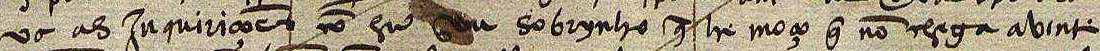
va as Jnquirições c̄o hū seu sobrynho q̄ he moço q̄ nō chega a vinte
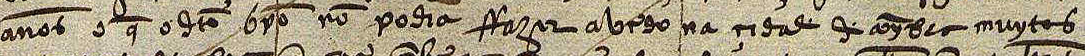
an̄os o q̄ o dt̄o bpō nō podia ffazer avēdo na cidade de cōybra muytos
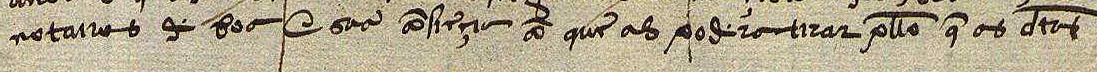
notairos de boa e saā c̄osiēcia c̄o quē as podera tirar p̄llo q̄ os d̄tos
